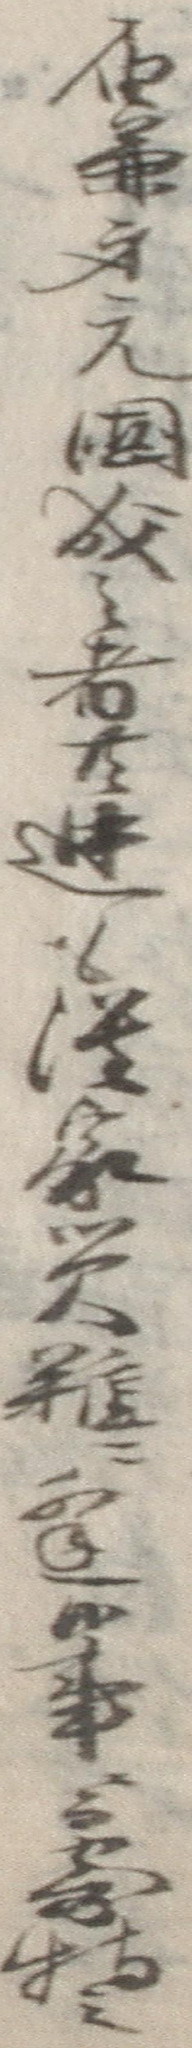届兼身元国成之者共迚も潰家災難二逢候事ニ而寄特之
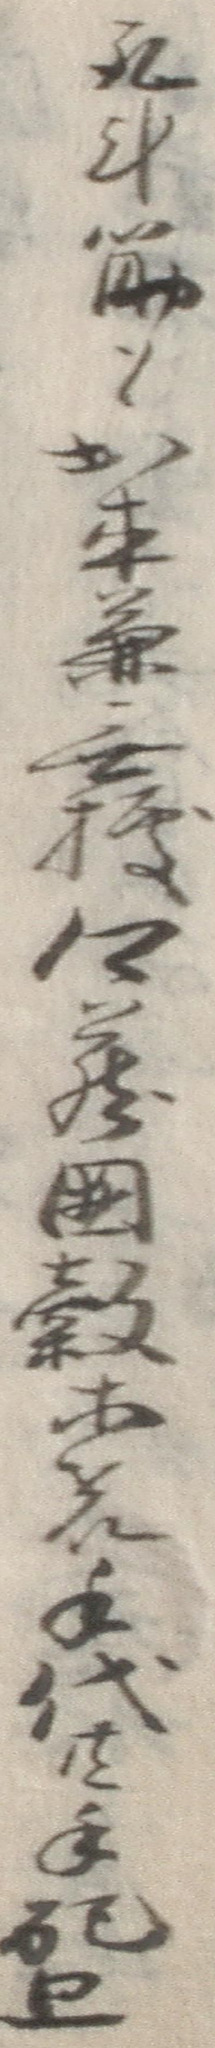取斗筋も出来兼無據郷蔵囲穀等差手代共手配廻
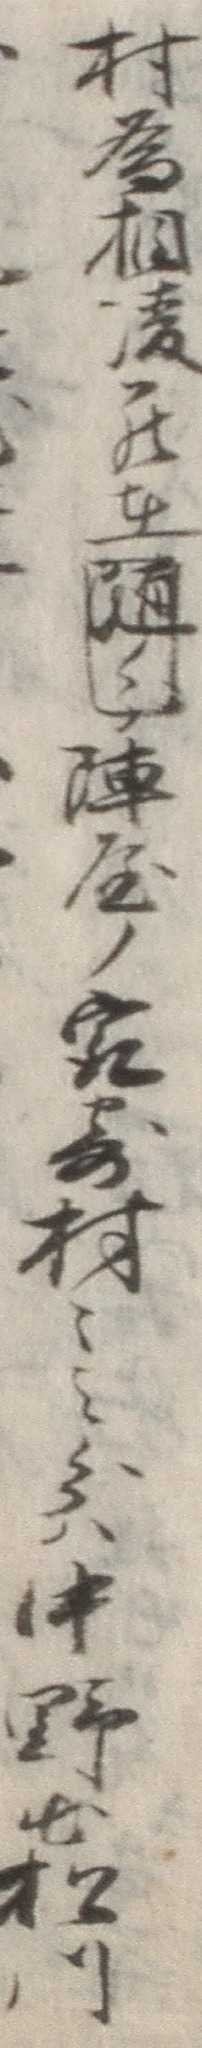村為相凌罷在随分陣屋ノ宛寄村々之分ハ中野屯松川
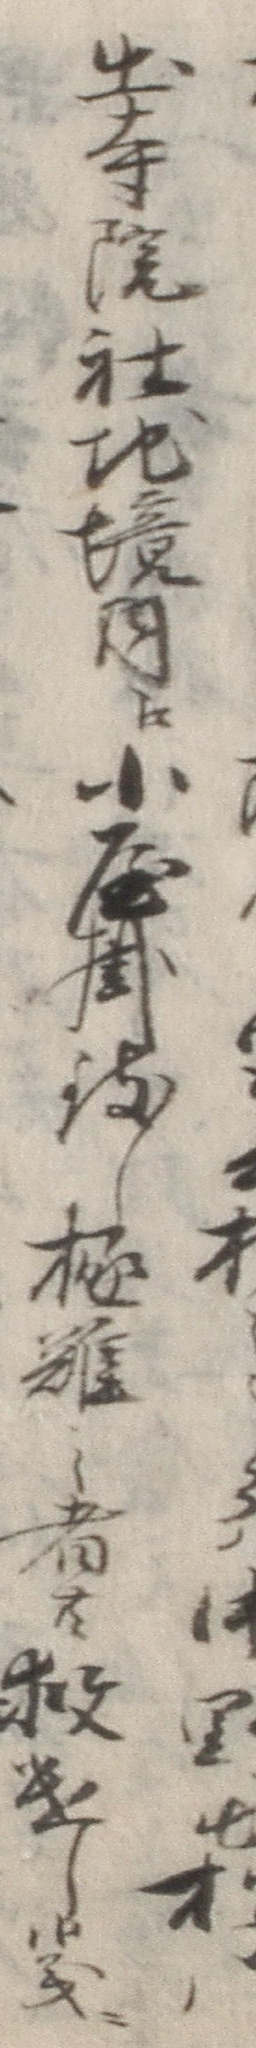出寺院社地境内江小屋掛致し極難之者共救遣し候義ニ
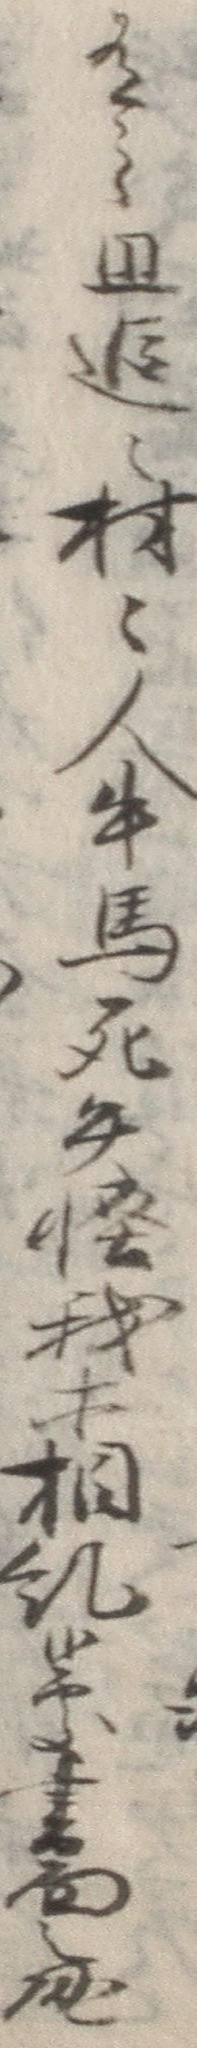有之且追々村々人牛馬死失怪我等相糺候處書面之通
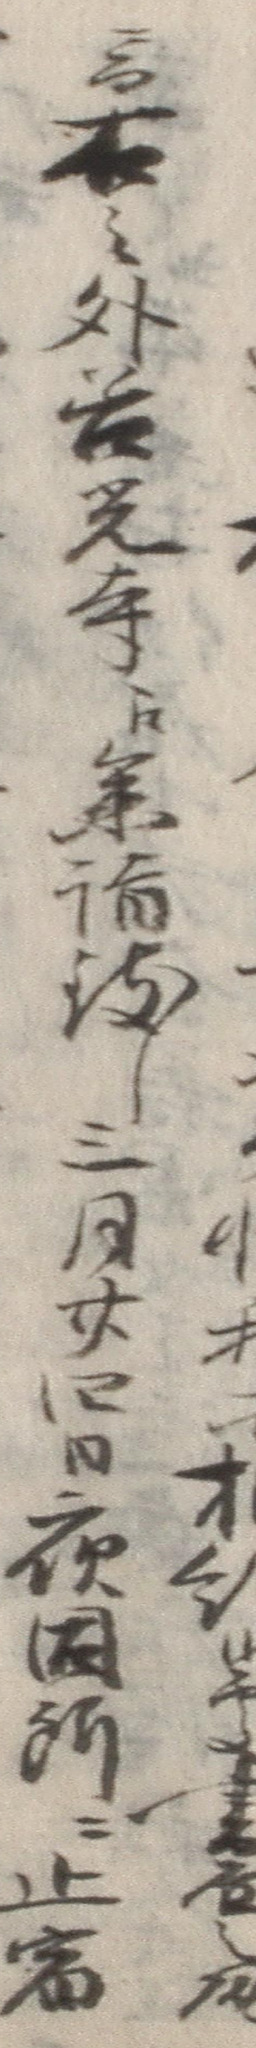ニ而右之外善光寺江参詣致し三月廿四日夜同所ニ止宿
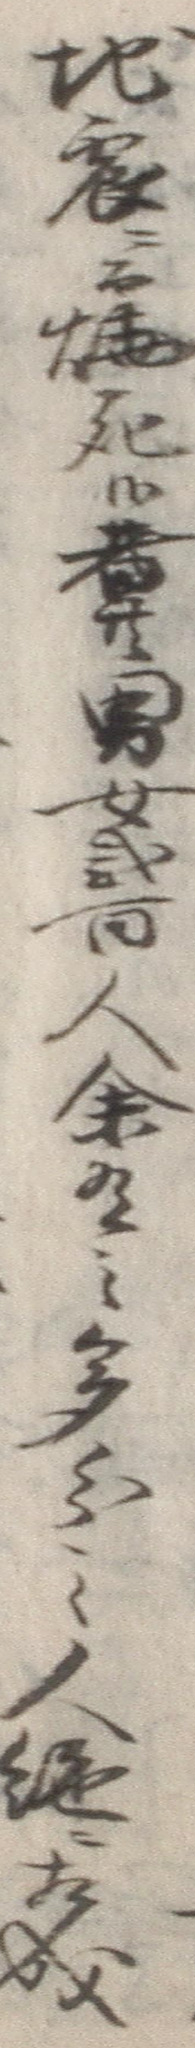地震ニ而焼死候者共男女弐百人余有之多分之人絶ニ相成
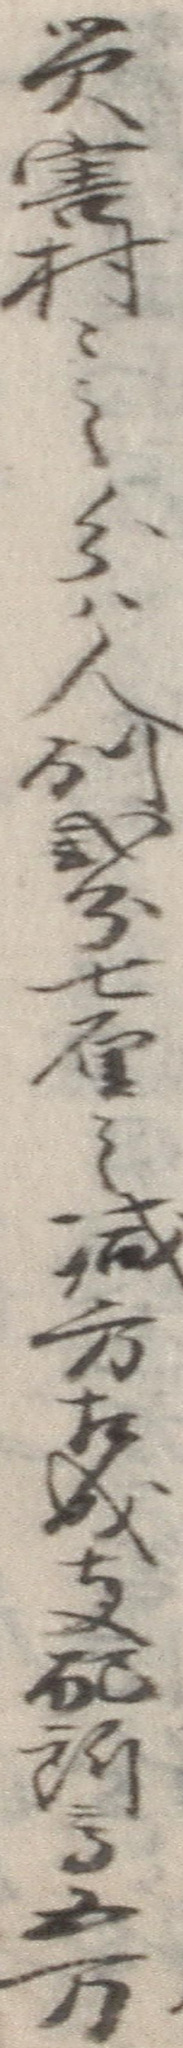災害村々之分ハ人別弐分七厘之減方相成支配所高五万
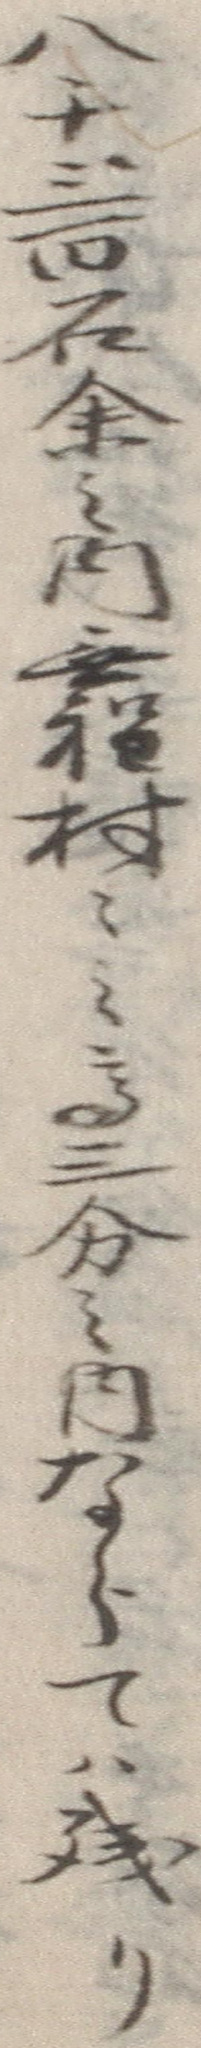八千三百石余之内無程村々之高三分之内ならてハ残り
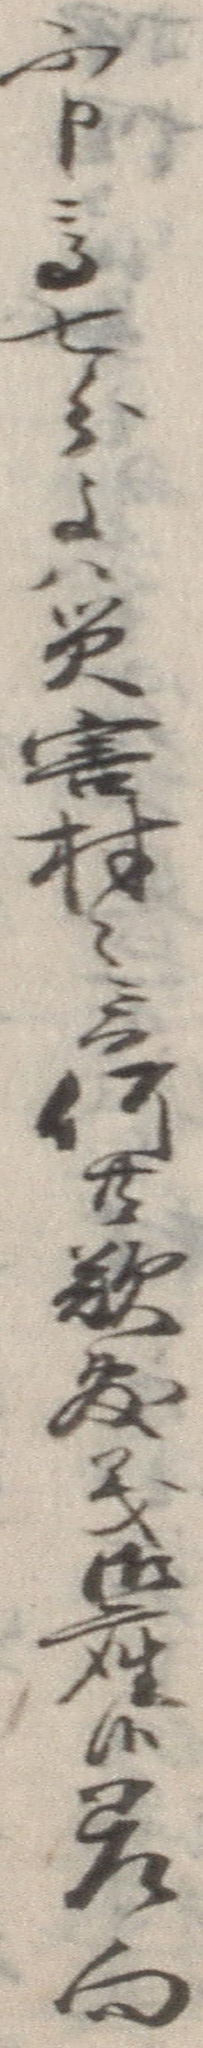不申高七分よハ災害村々ニ而何共歎敷義御座候差向
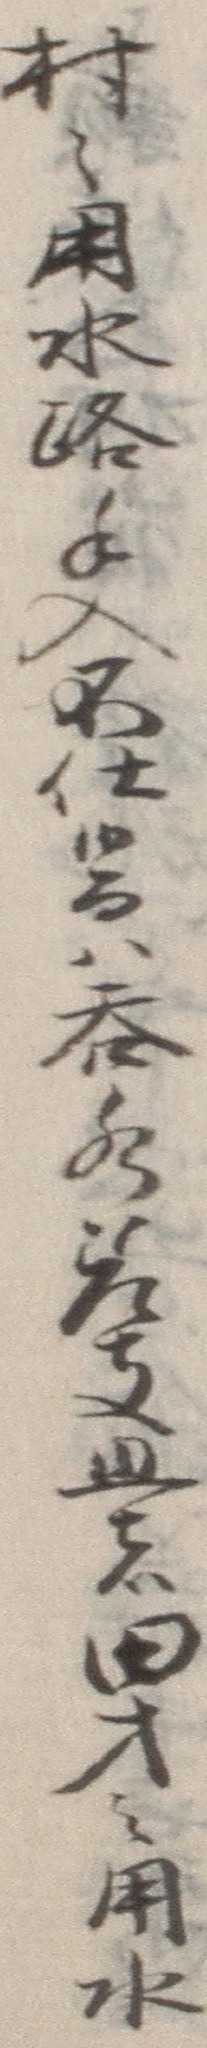村々用水路手入不仕候而ハ呑水差支且者田方之用水
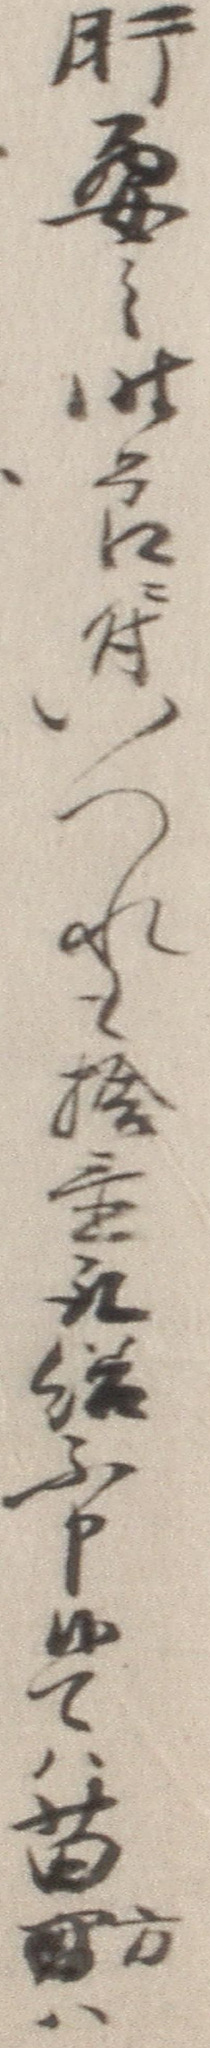肝要之時節ニ付いつれも捨置取繕不申候てハ苗方ハ
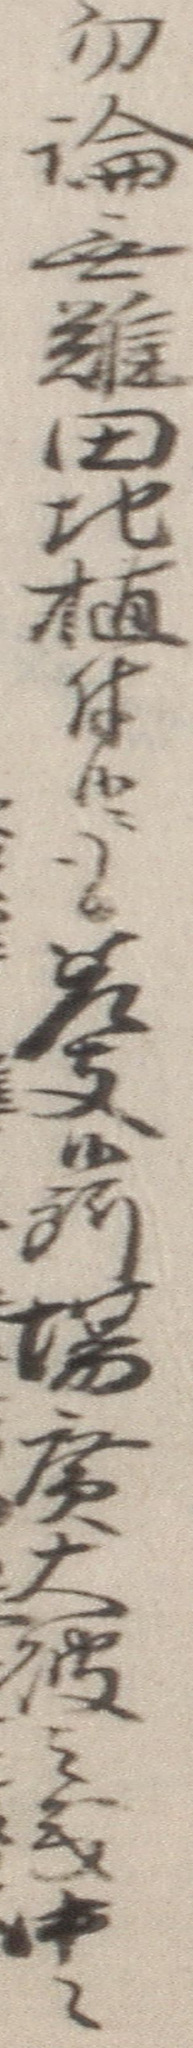勿論無難田地植付候ニも差支候所場広大破之義中々
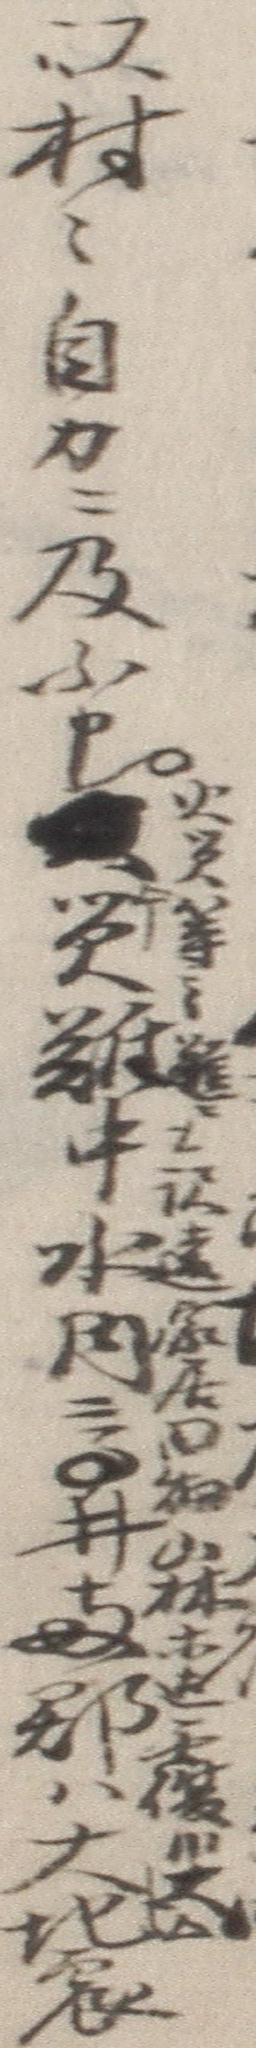以村々自力ニ及不申〇災難中水内高井両郡ハ大地震
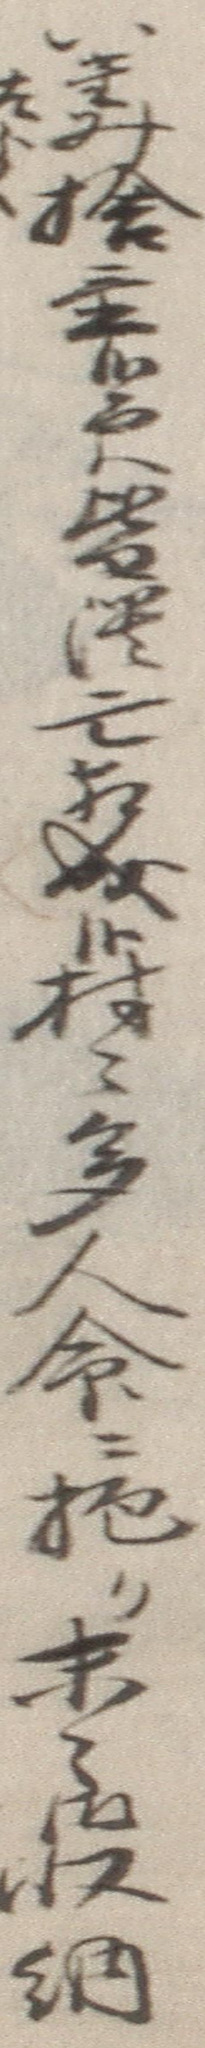いたみ捨置候而は皆潰亡相成候村々多人命ニ抱リ末々御収納
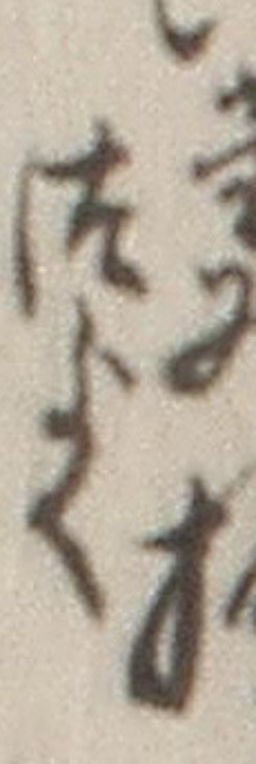つよく
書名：[善光寺地震に関する冊子]
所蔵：東京大学地震研究所図書室 Earthquake Research Institute Library, The University of Tokyo, JAPAN
